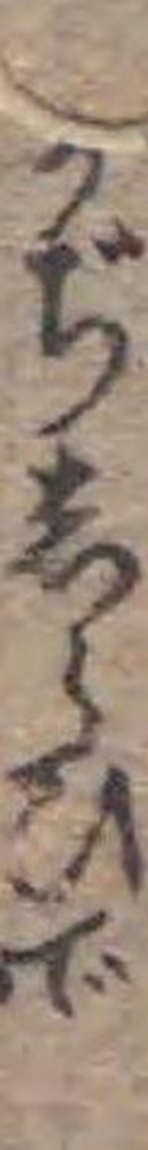かぢしらひで
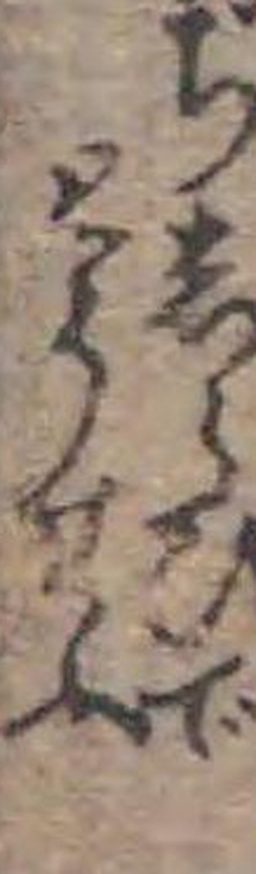とうせふ
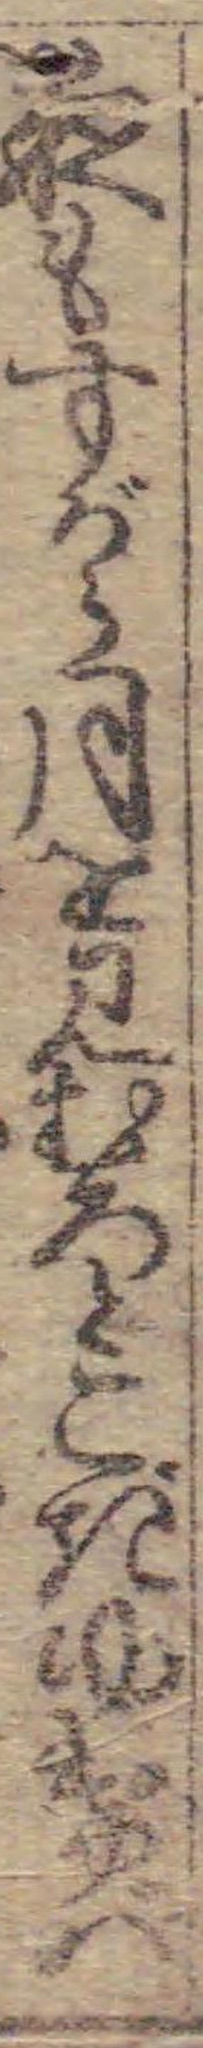夜もすがら月を見むろとこぎゆけば
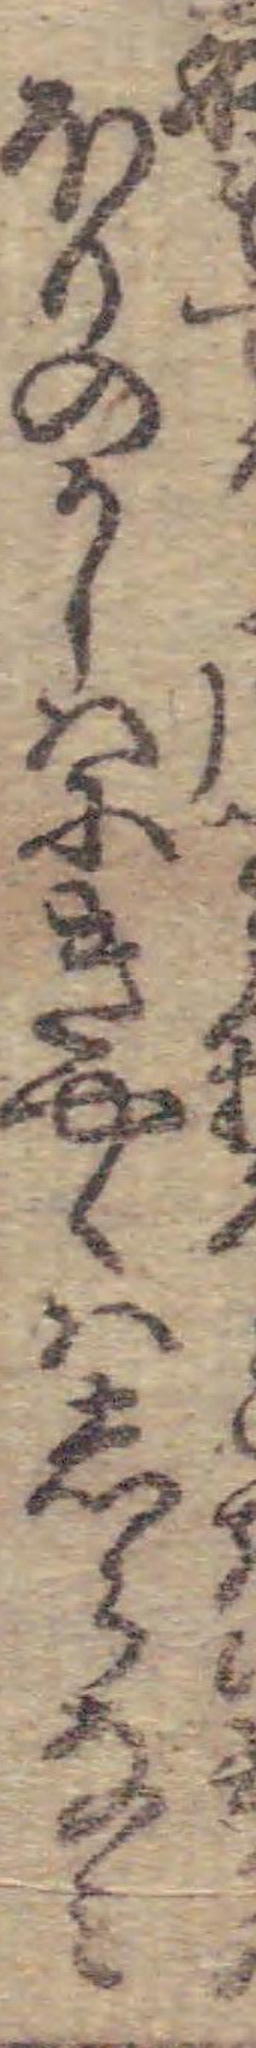ほりのかしはにきやくはしらなみ
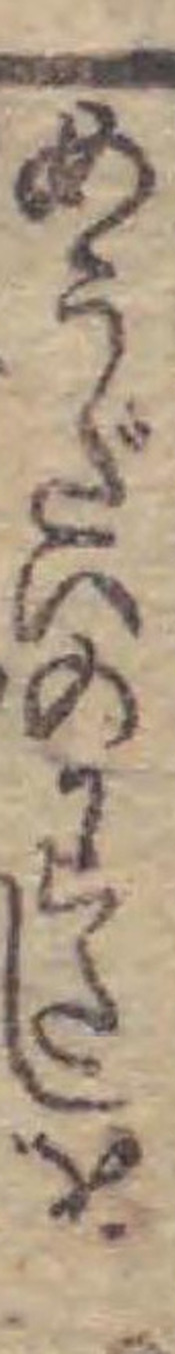めうだいのわたしを
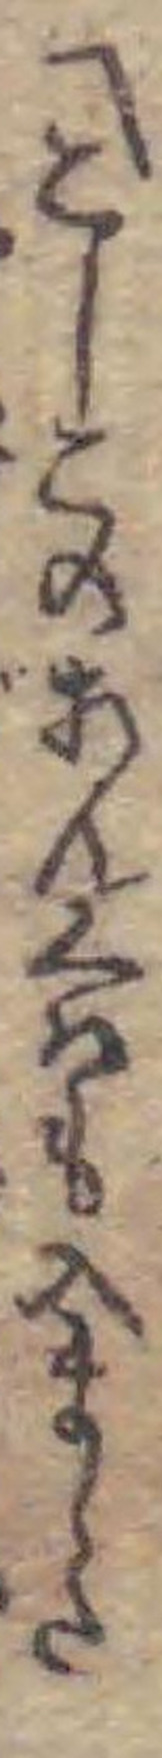〽こしこのあんくはも入れました
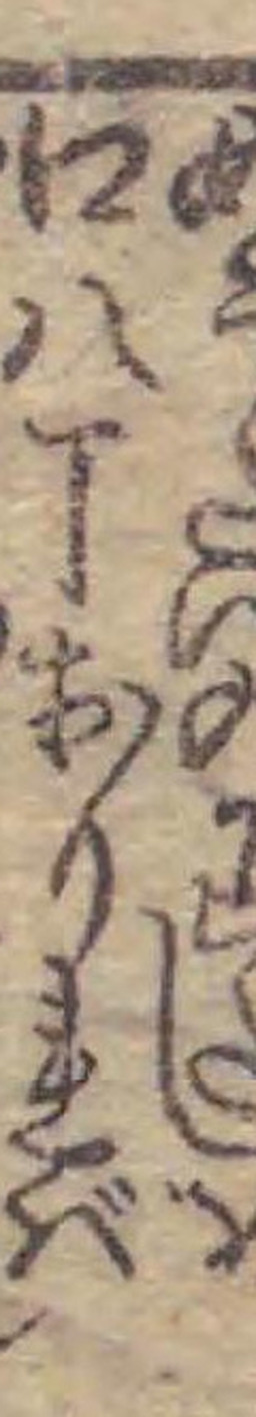口八丁おりれば
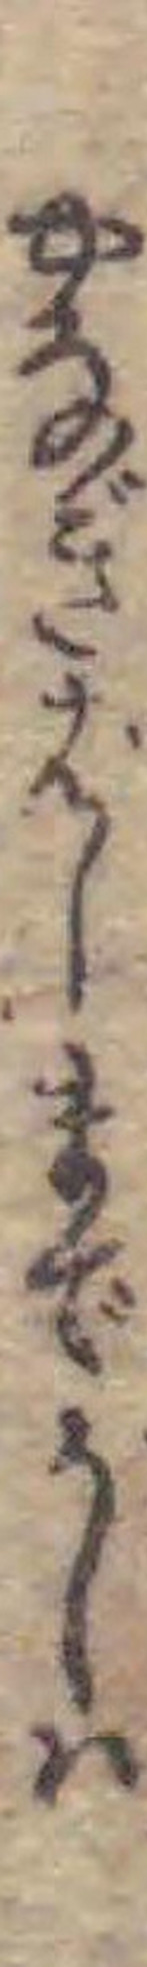やなぎばしまでかしは
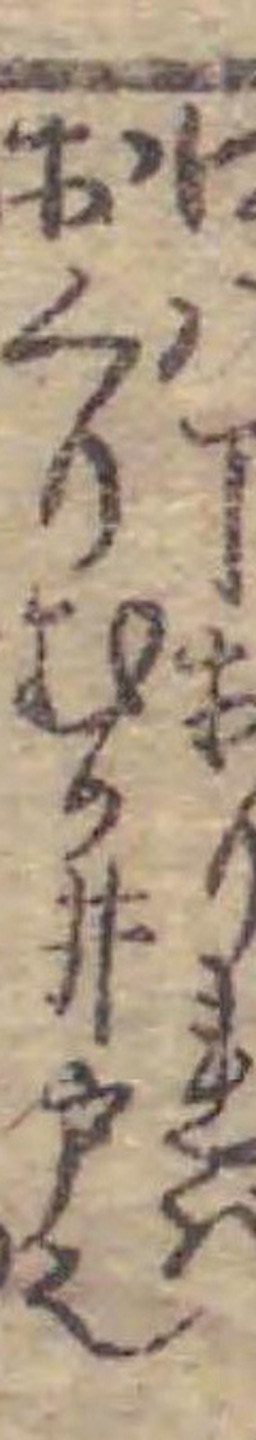おくりむか井戸也
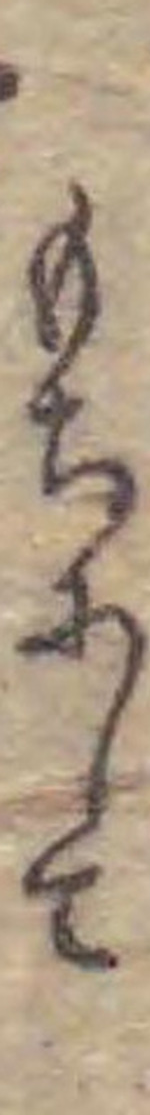もちにして
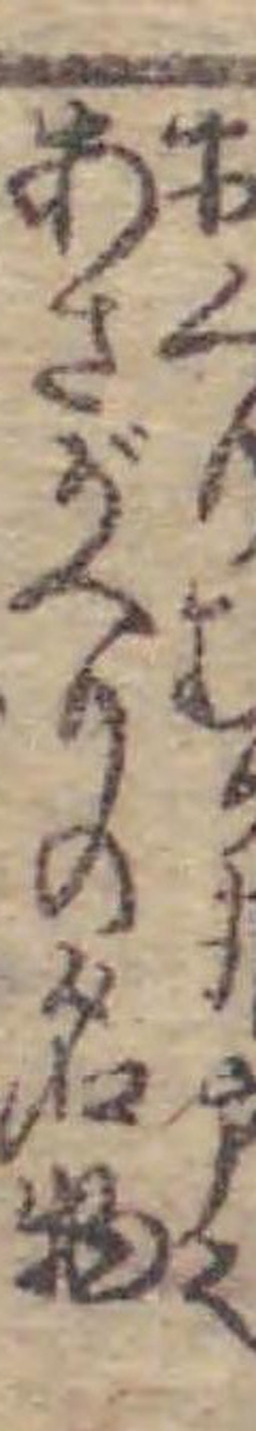あさがへりの名物
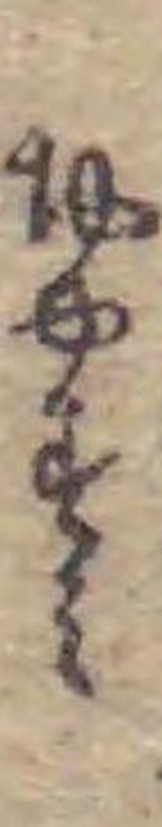おやすみ
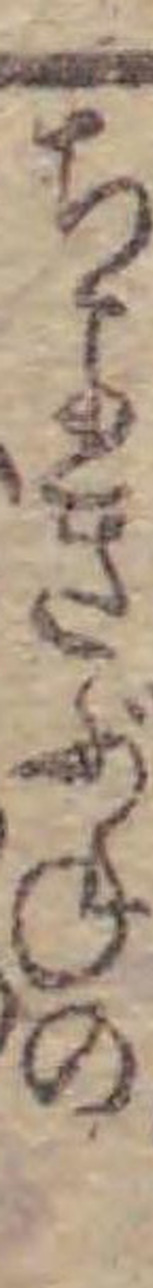ちよきぶねの
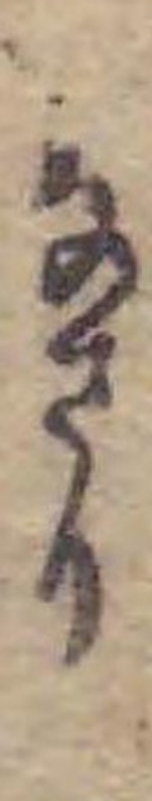なさり
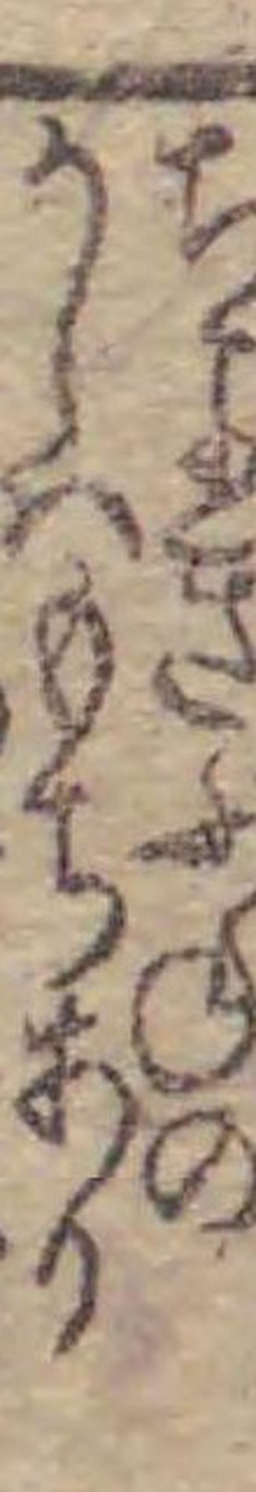かしはもちあり
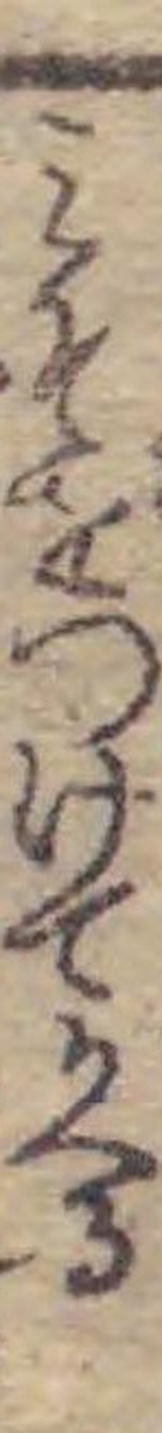みそをつけてかへる
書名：北国順礼唄方便 : 3巻
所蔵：国立国会図書館 National Diet Library, JAPAN
